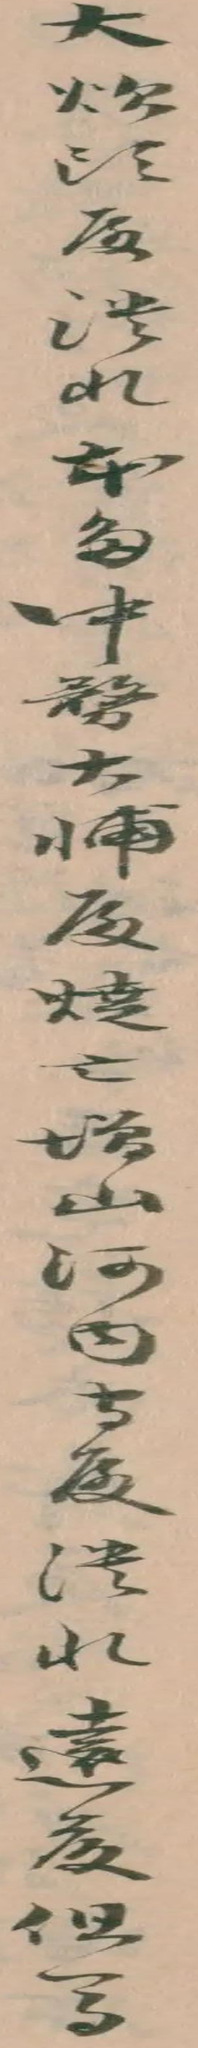大炊頭殿潰れ本多中務大輔殿焼亡増山河内守殿潰れ遠藤但馬
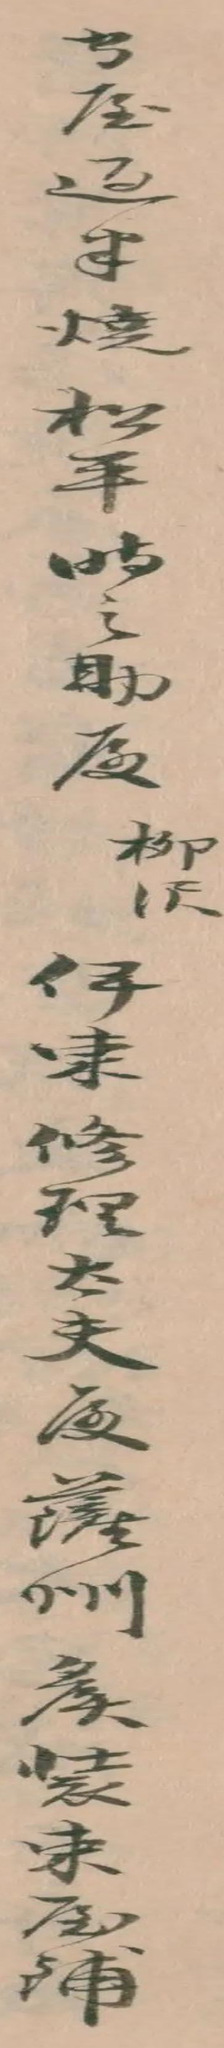守殿辺半焼松平時之助殿柳沢伊東修理太夫殿薩州侯装束屋舗
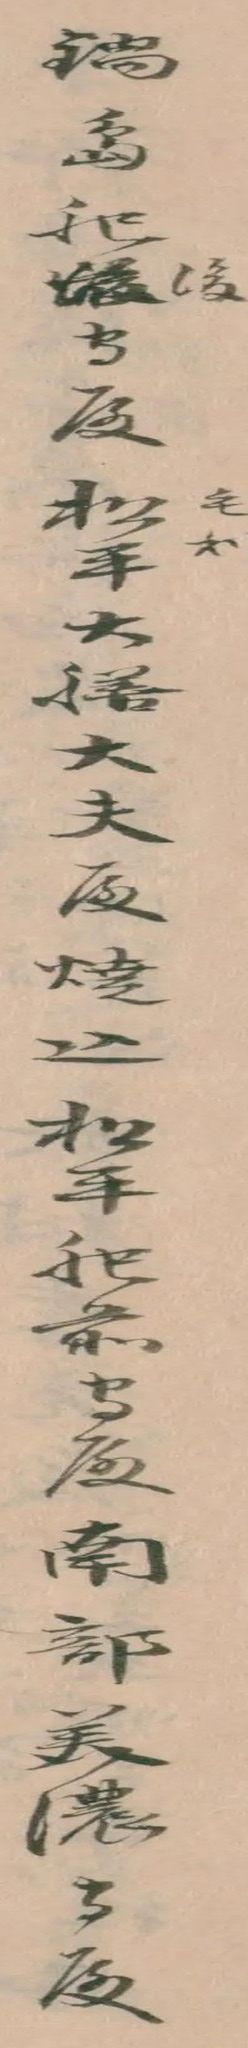鍋島肥後守殿松平大膳大夫殿焼込松平肥前守殿南部美濃守殿
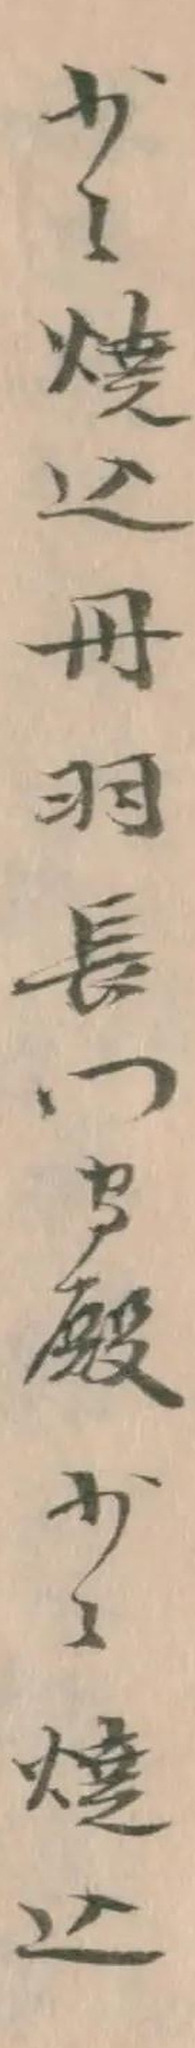少々焼込丹羽長門守殿少々焼込
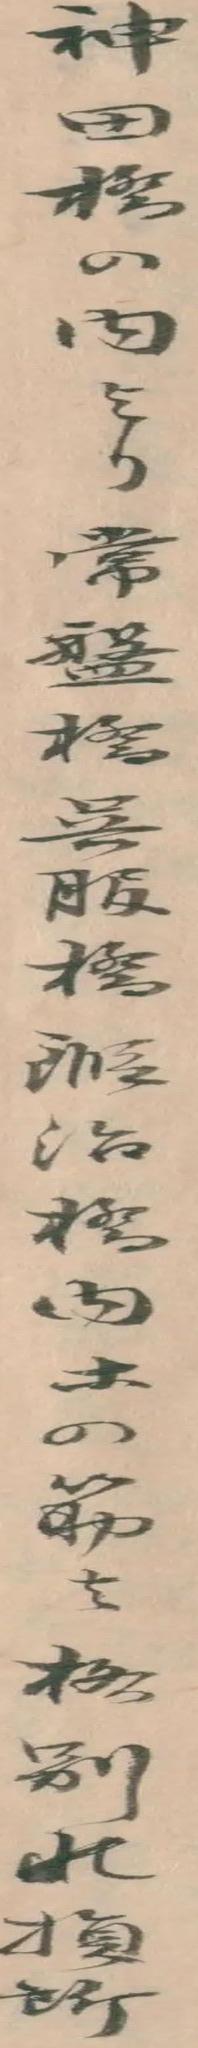神田橋の内より常盤橋呉服橋鍛冶橋内等の筋は格別の損所

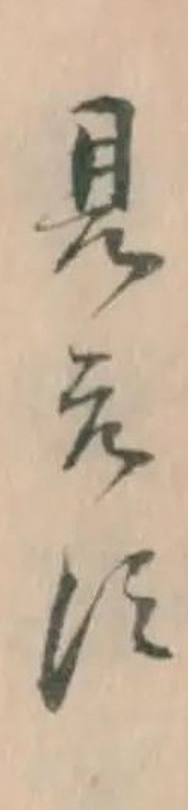見えす
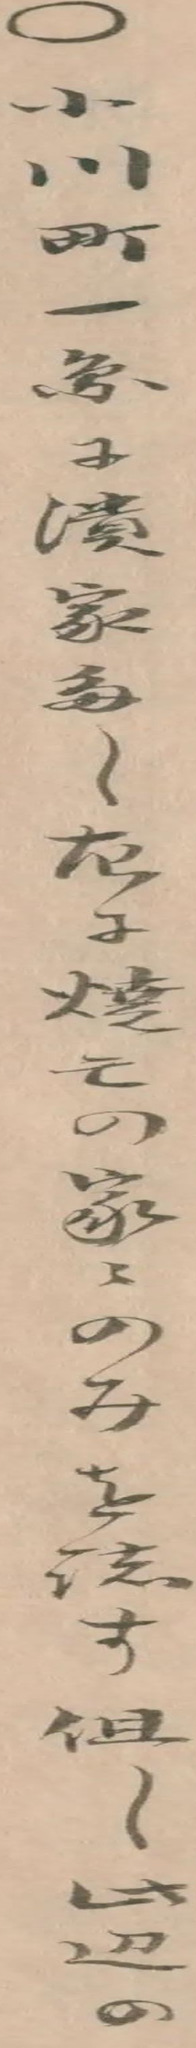○小川町一円に潰家多し左に焼亡の家々のみを誌す但し此辺の
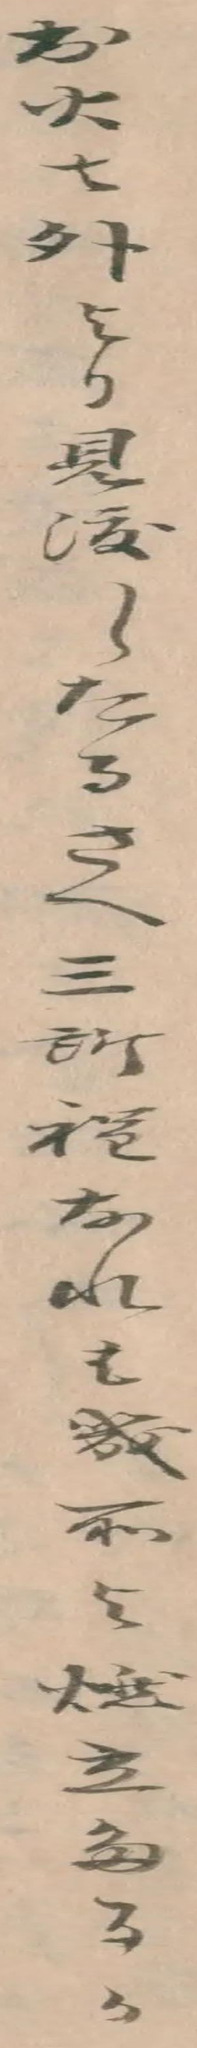出火は外より見渡したるさへ三所程なれは幾所と燃立たるか
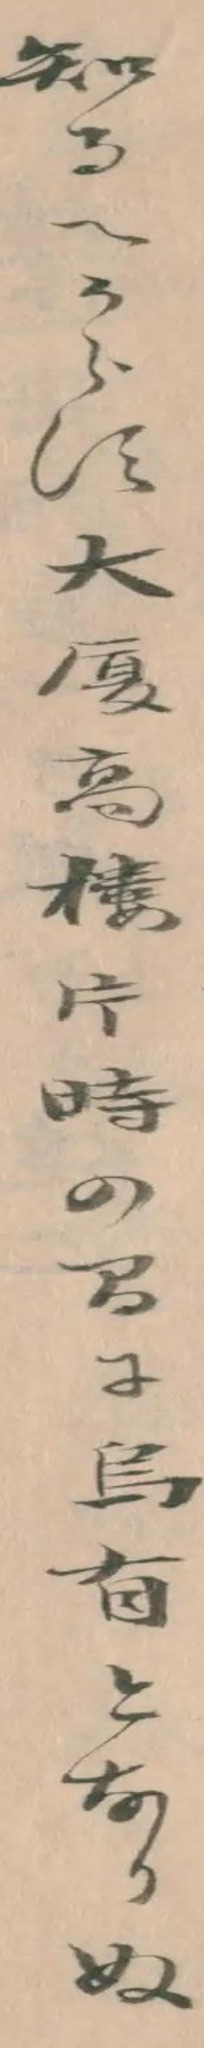知るへからす大厦高楼片時の間に烏有となりぬ

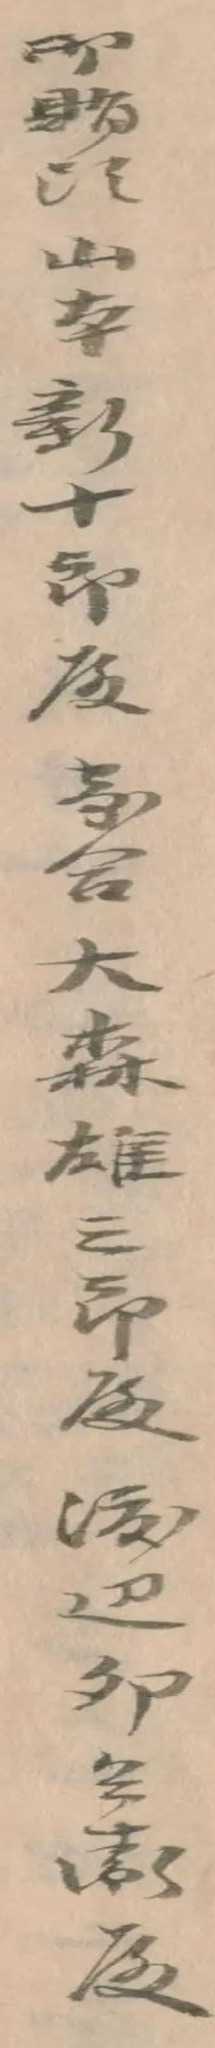御賄頭山本新十郎殿寄合大森雄三郎殿渡辺卯兵衛殿
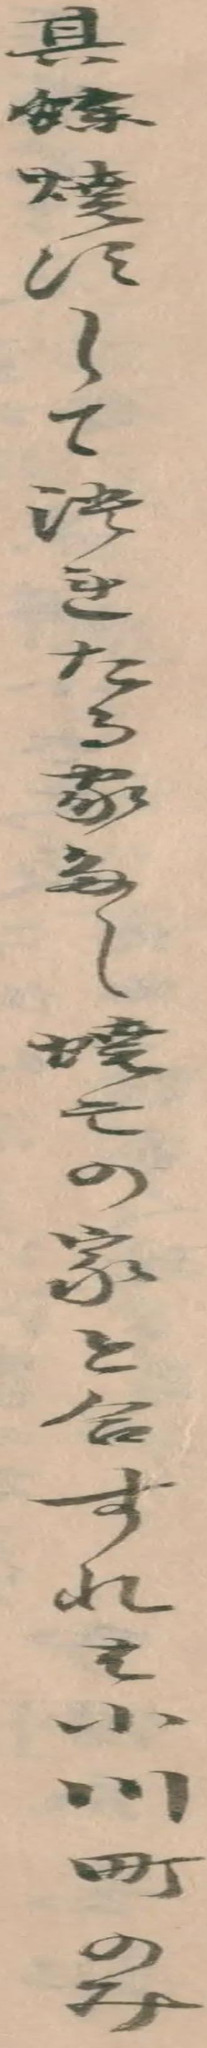其餘焼すして潰れたる家多し焼亡の家と合すれは小川町のみ
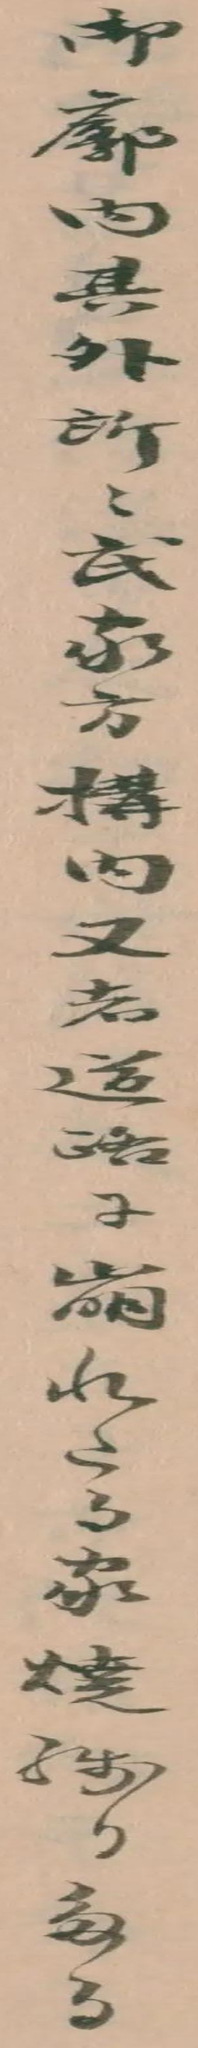御廊内其外所々武家方構内又は道路に崩れる家焼残りたる
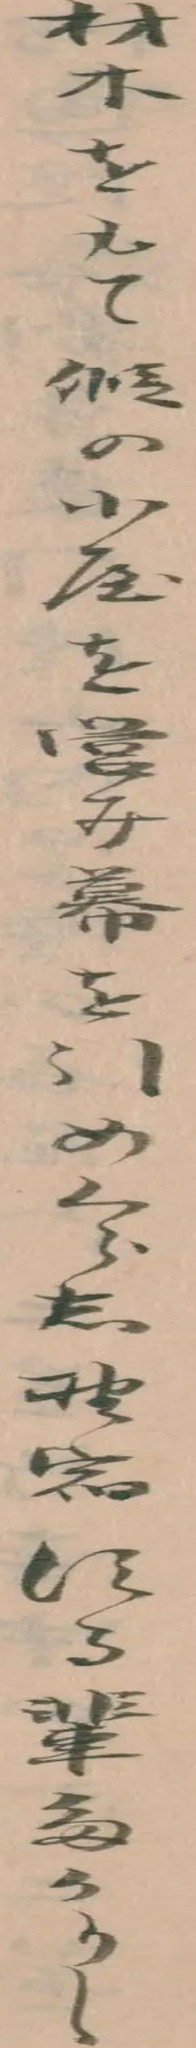材木をもて假の小屋を営み幕を引めくらし野宿する輩多かりし
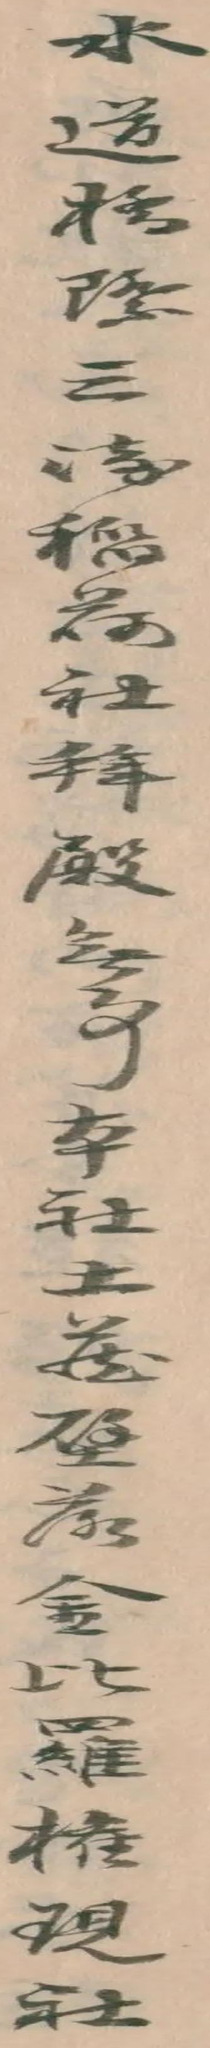水道橋際三崎稲荷社拝殿無事本社土蔵壁落金比羅権現社
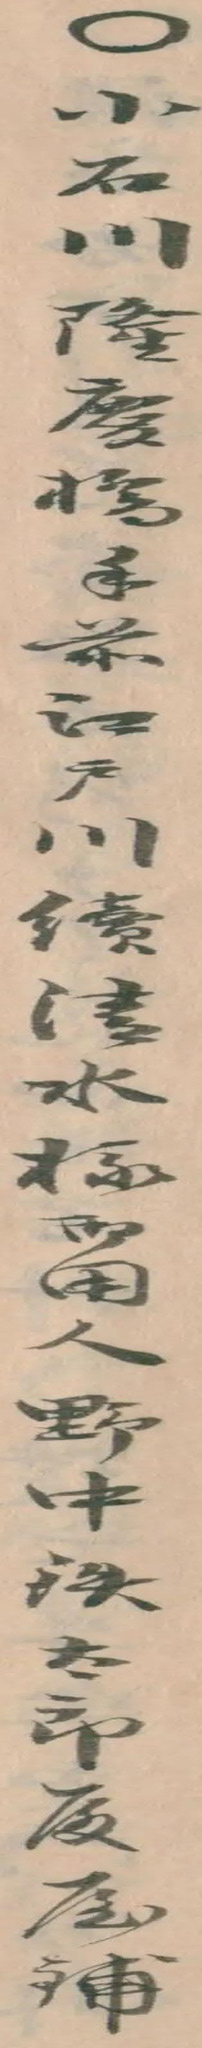〇小石川隆慶橋手前江戸川続清水様御用人野中鉄太郎殿屋鋪

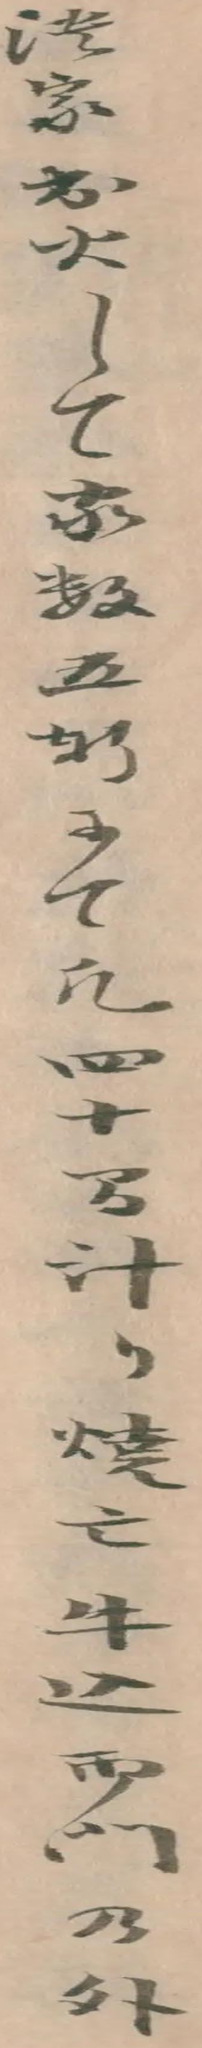潰家出火して家数五軒にて凡四十間計り焼亡牛込御門の外
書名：地災撮要. 巻7-9(地震之部)
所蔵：国立国会図書館 National Diet Library, JAPAN
